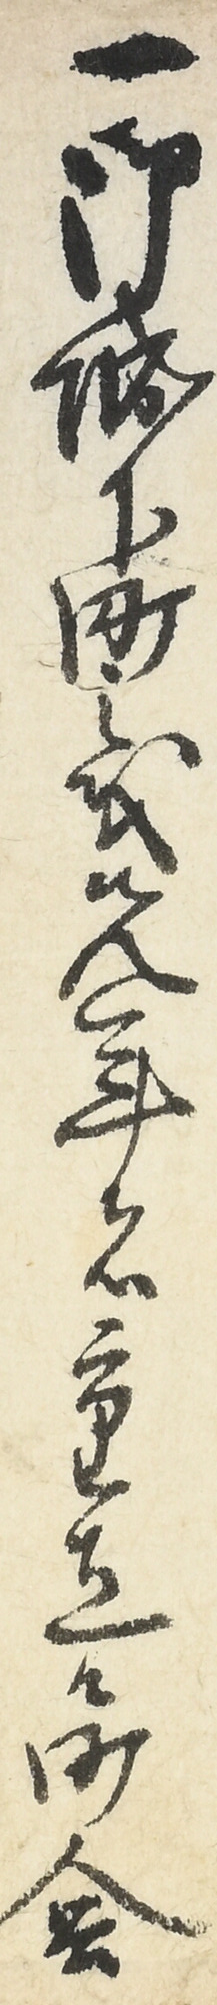一御城下町之義先年は重立候町会
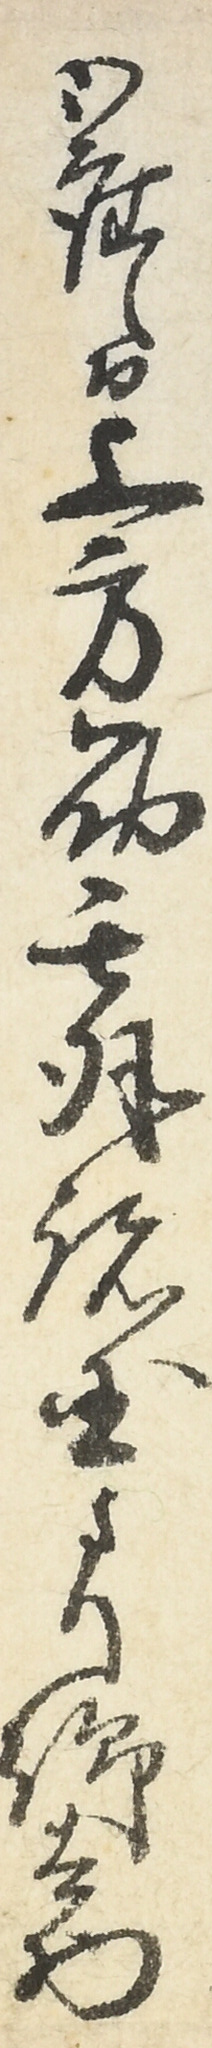御座候而上方筋其外諸国より御太物
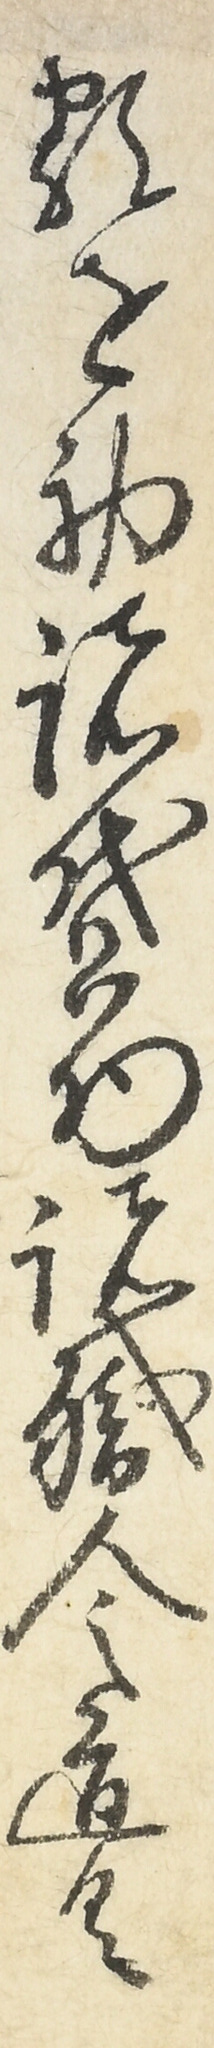類を初諸貸物諸職人之通具
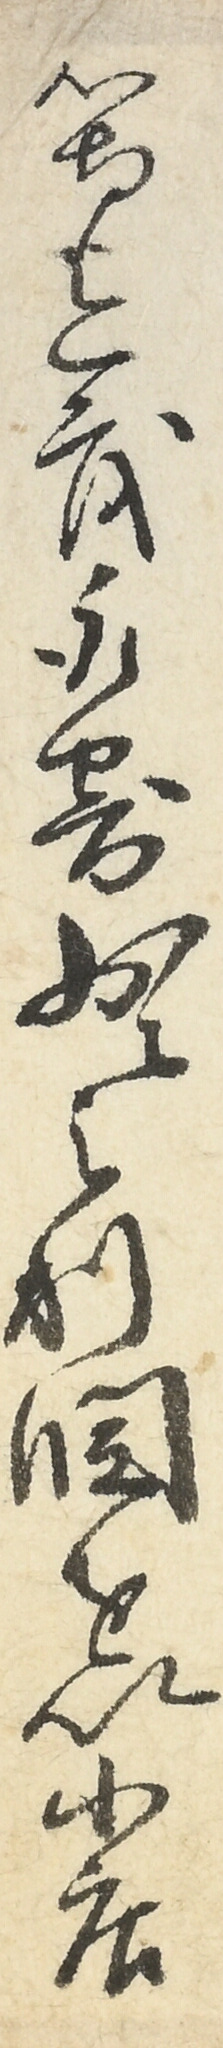等迄も取寄少々之利潤を以小店

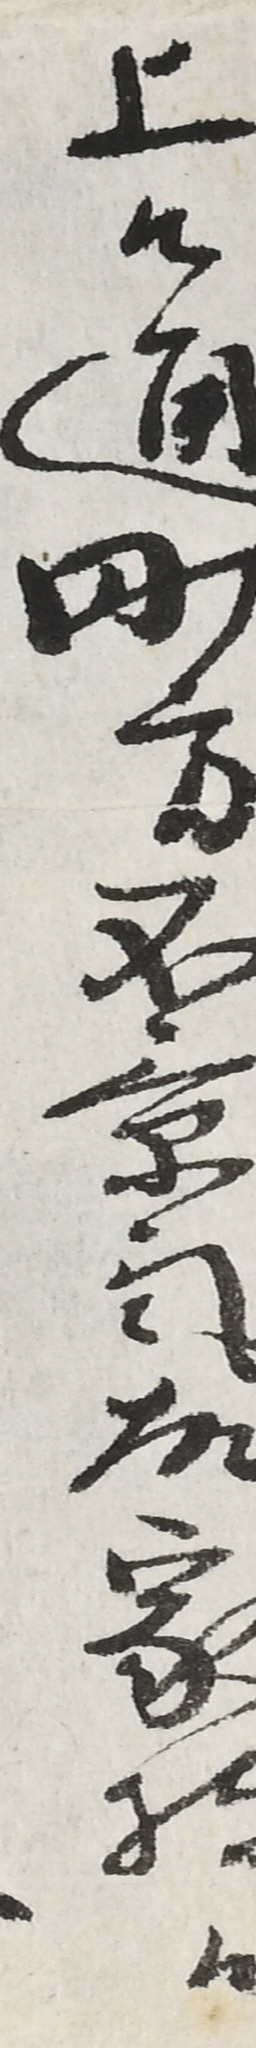上候通町方不景気故家持候
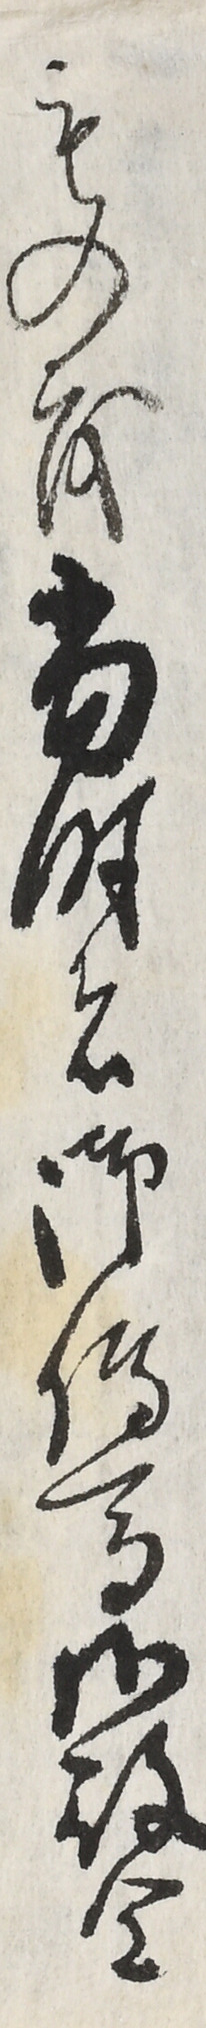ものも当時は御伝馬御役金
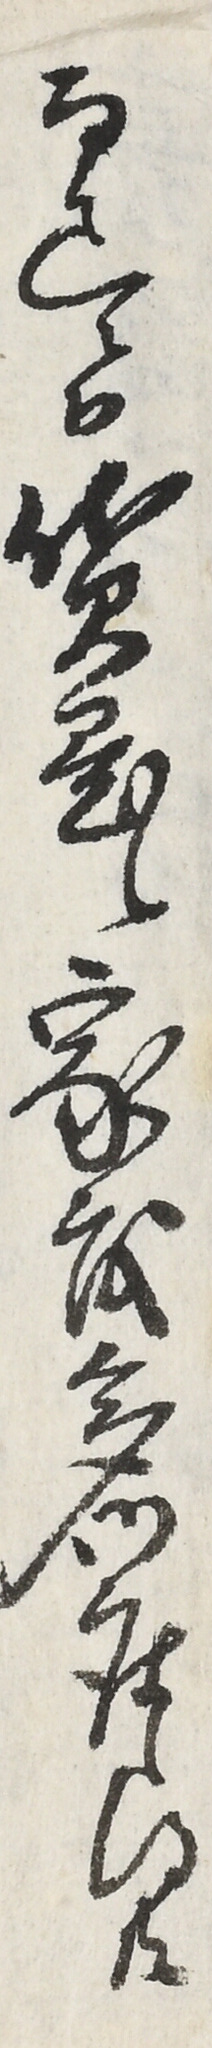而已ニ而貸置候家も多御座候得共
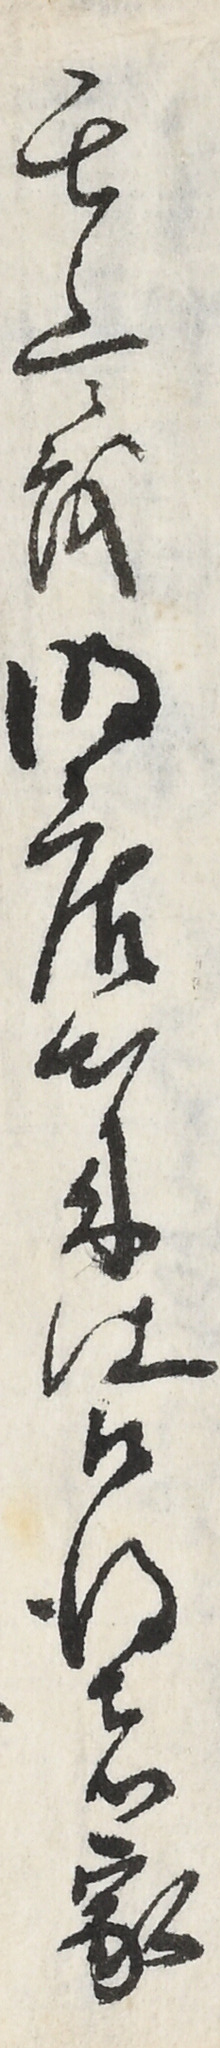其上ニも明店出来仕候得は家
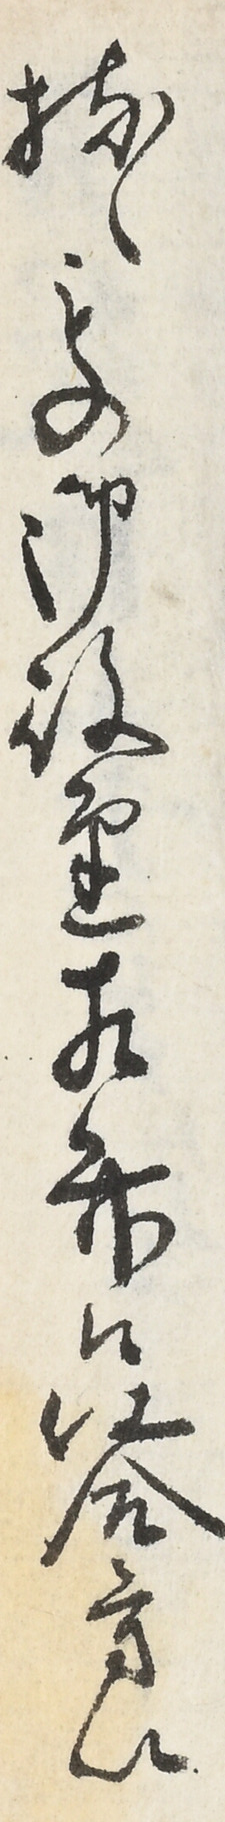持候もの御役金相弁候仕合旁以
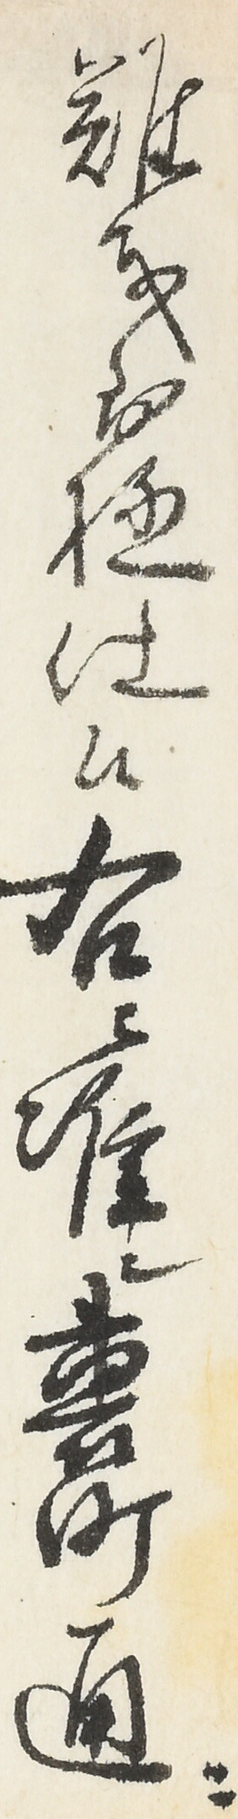難義至極仕候右ニ准シ裏町通ニ
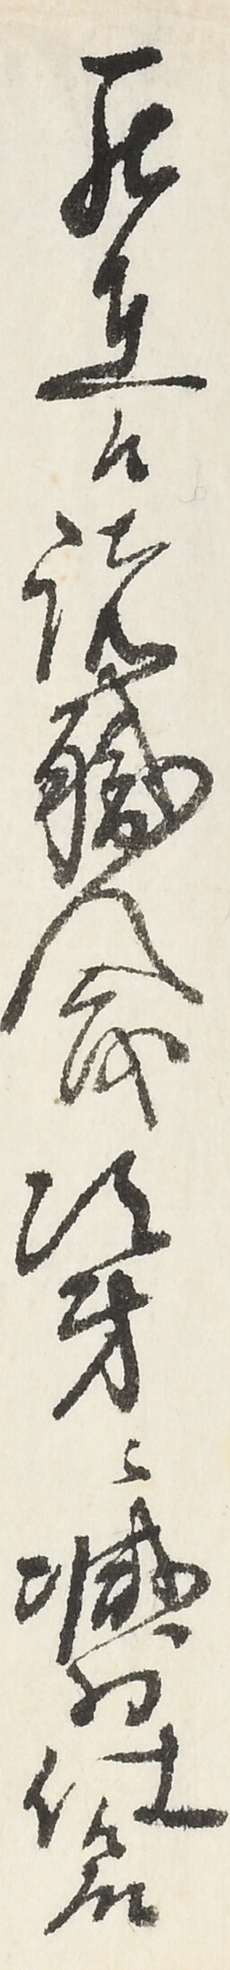罷在候諸職人も次第ニ減少仕候故
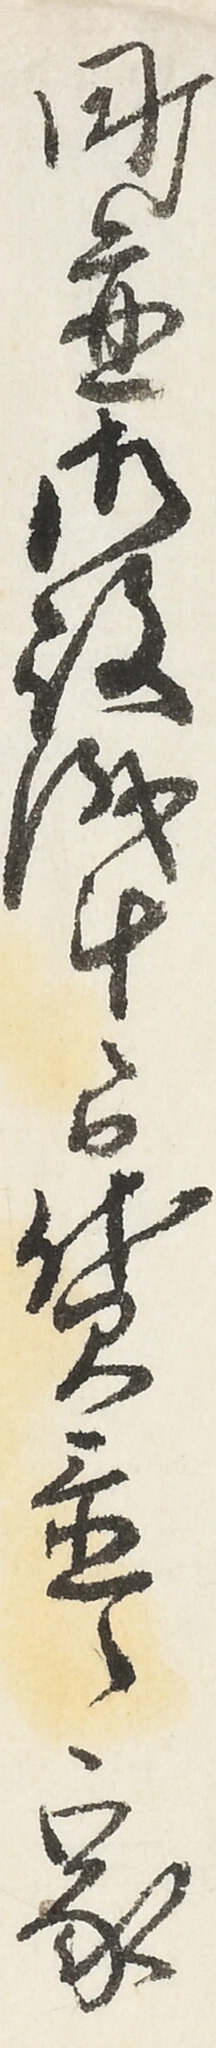町並御役儀計ニ而貸置候家
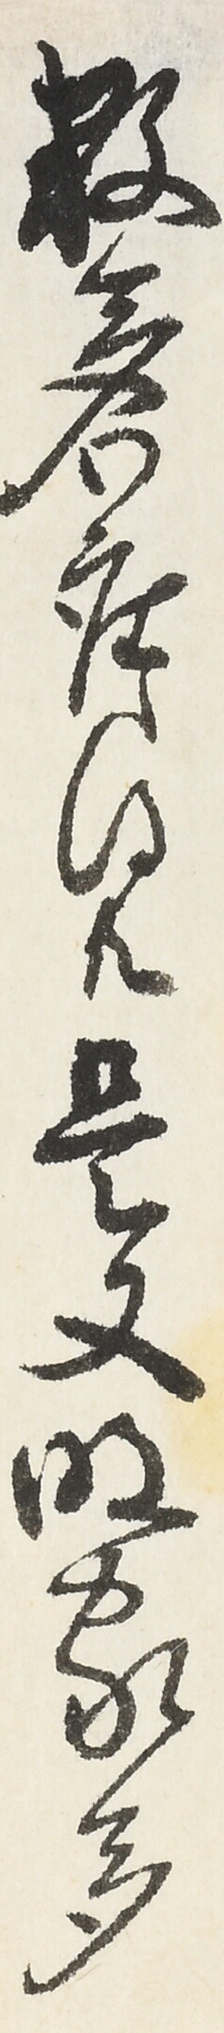数多御座候得共是又明家多
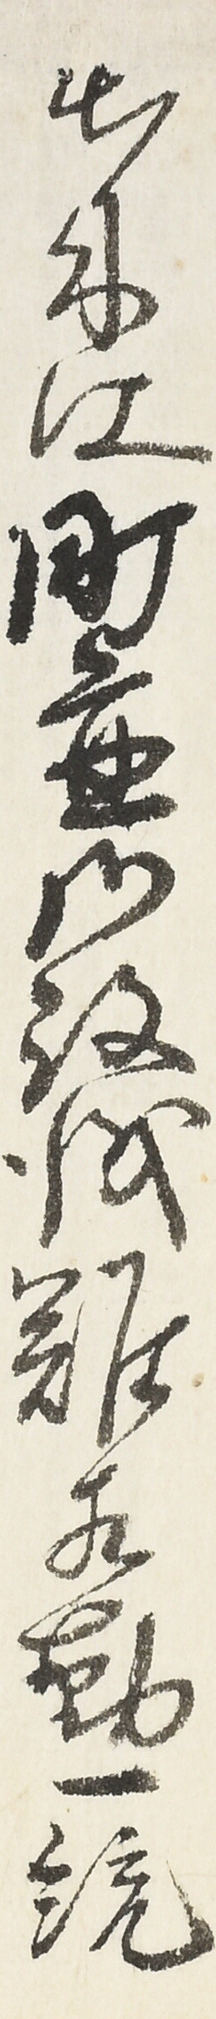出来仕町並御役儀難有勤一統
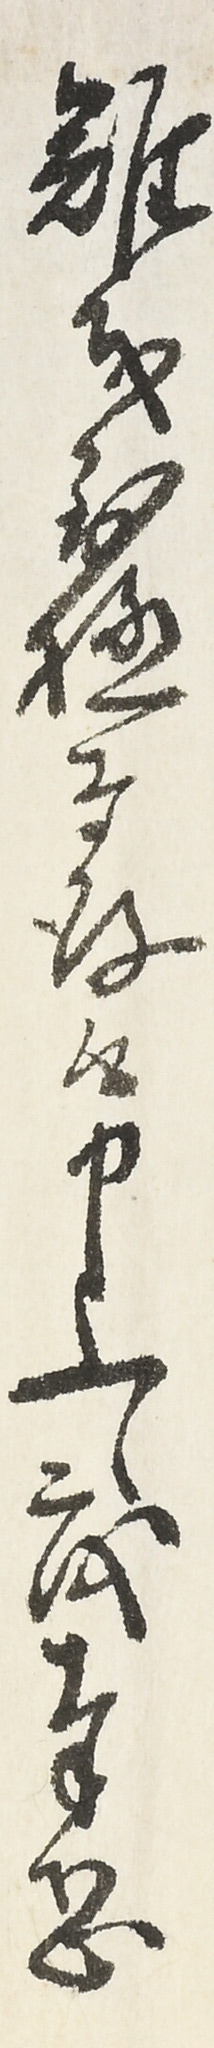難義至極奉存候申上候も奉恐
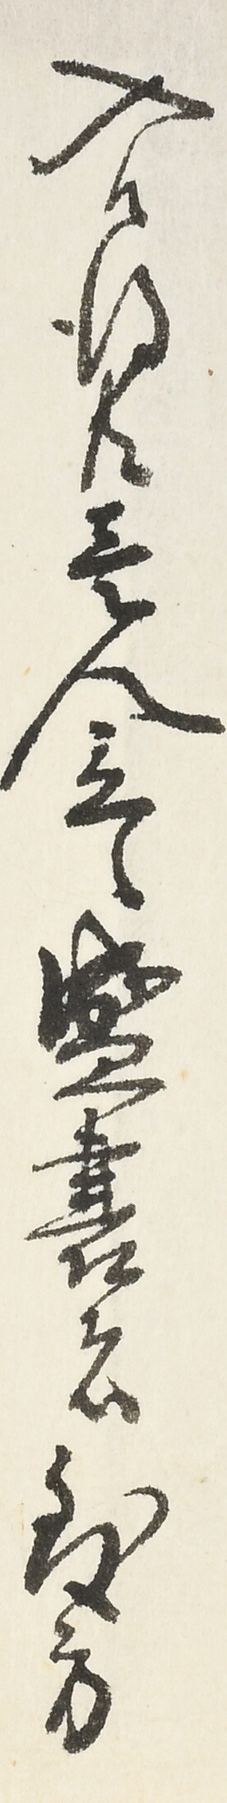入候得共壱人立候盛衰は致方
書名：乍恐以口上書奉願上候御事
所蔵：伊那市立高遠町図書館・合同会社AMANE
